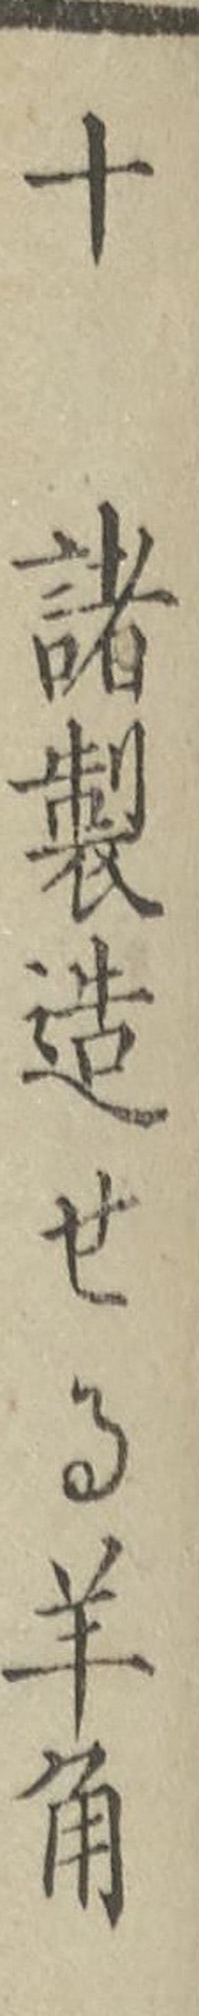十諸製造せる羊角
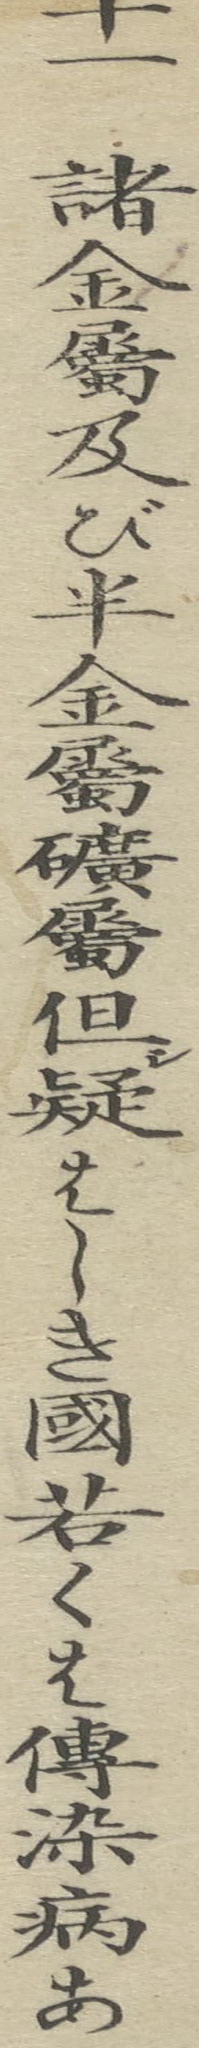十一諸金屬及び半金屬礦屬但疑はしき國若くは傅染病あ
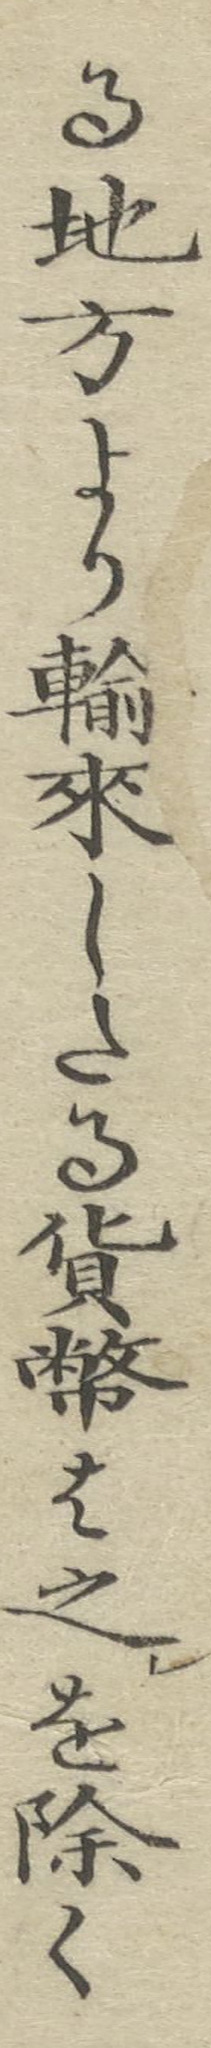る地方より輸來したる貨幣は之除く
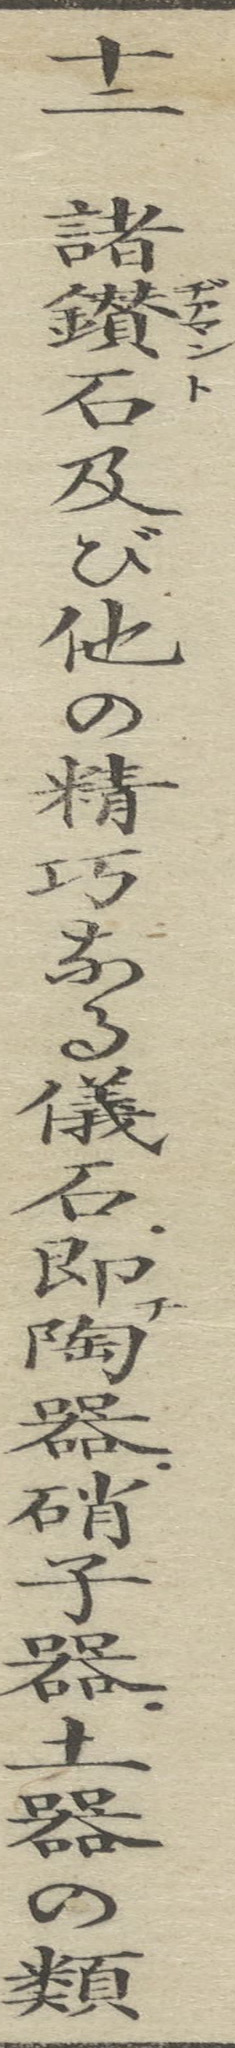十二諸鑚石及び他の精巧なる儀石即陶器、硝子器、土器の類
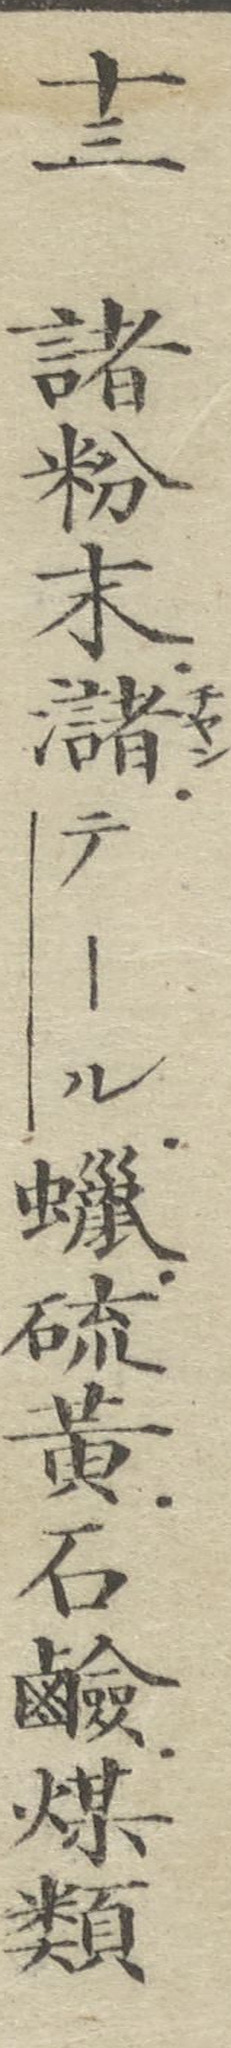十三諸粉末、櫧、テール、蝋、硫黄、石鹸、煤類
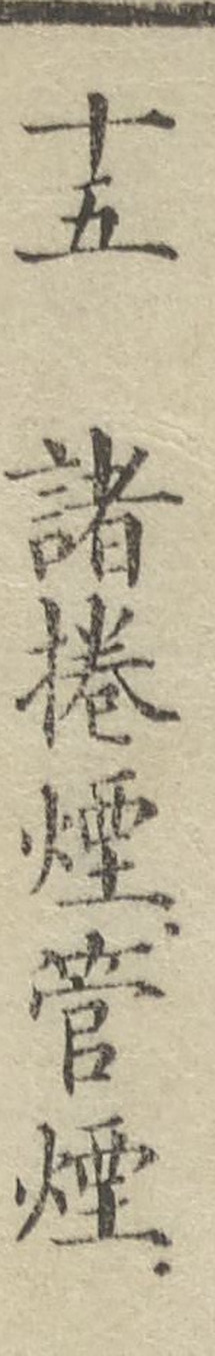十五諸捲煙、管煙、
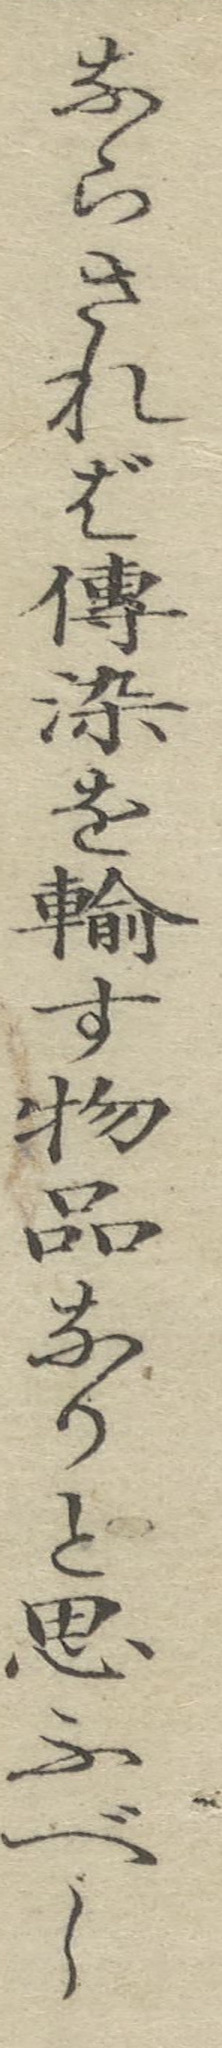ならされば傅染を輸す物品なりと思ふべし
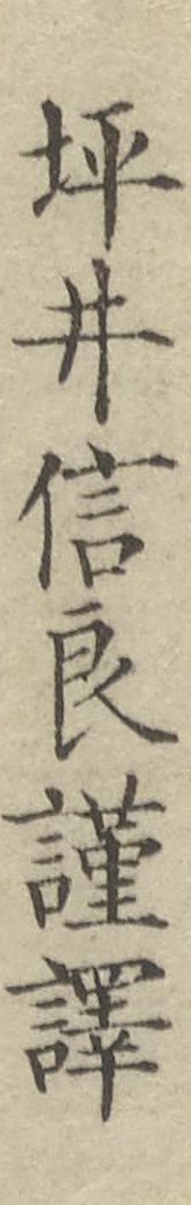坪井信良謹譯

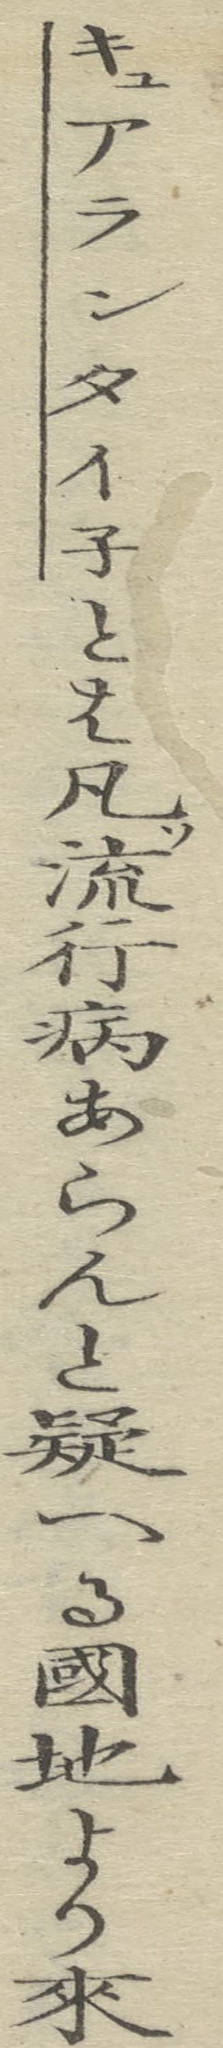キュアランタイニとは凡流行病あらんと疑へる國地より來
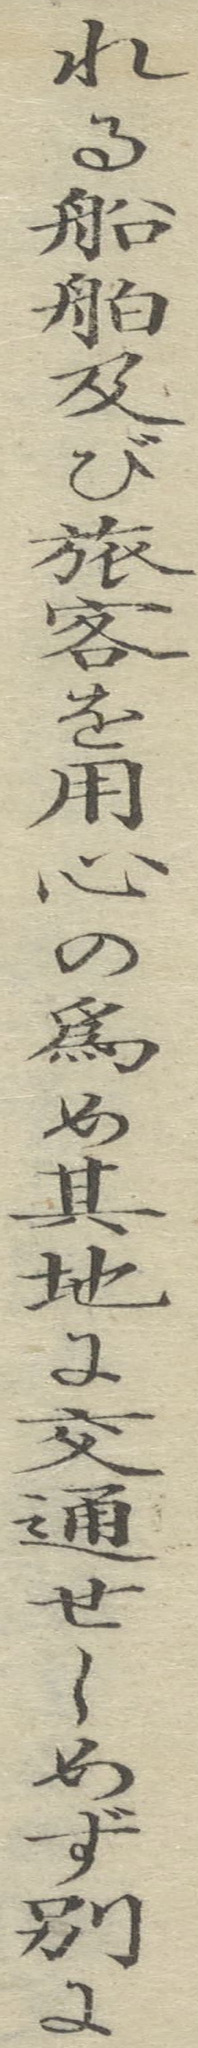れる船舶及び旅客を用心の為め其地に交通せしめず別に
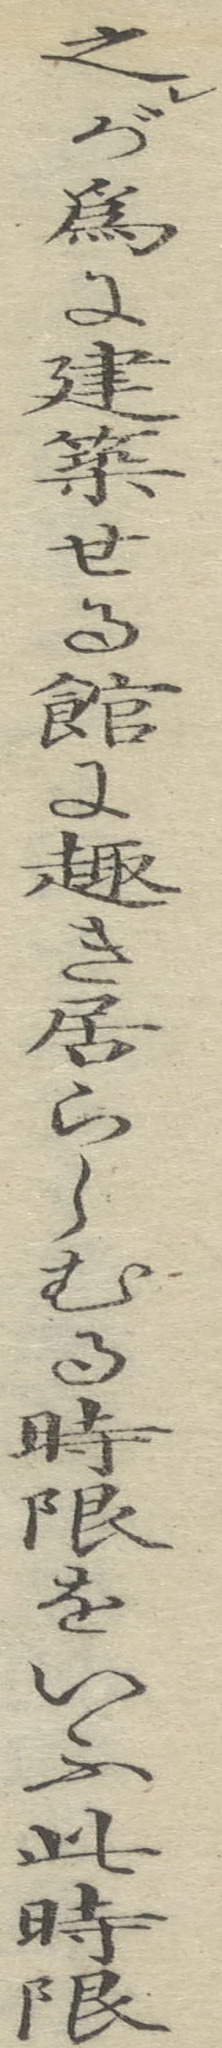之為に建築せる館に趣き居らしむる時限をいふ此時限
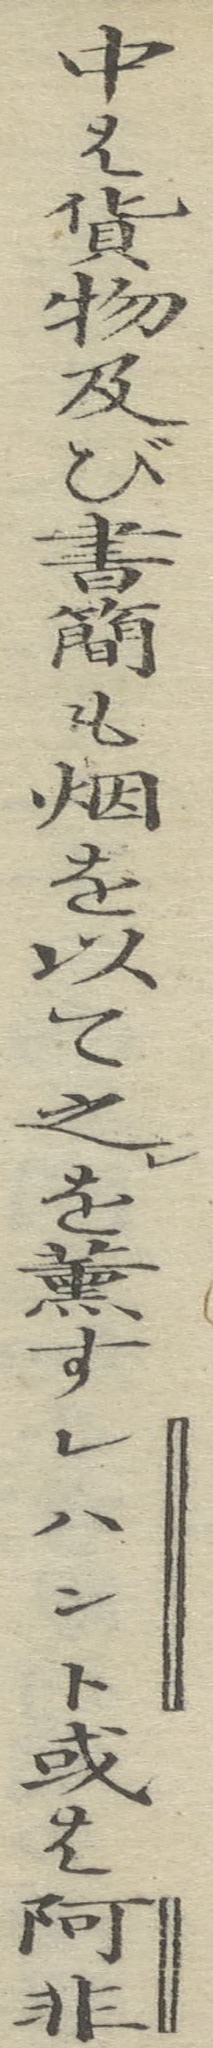中は貨物及び書簡も烟を以て之薫すレハント或は阿非
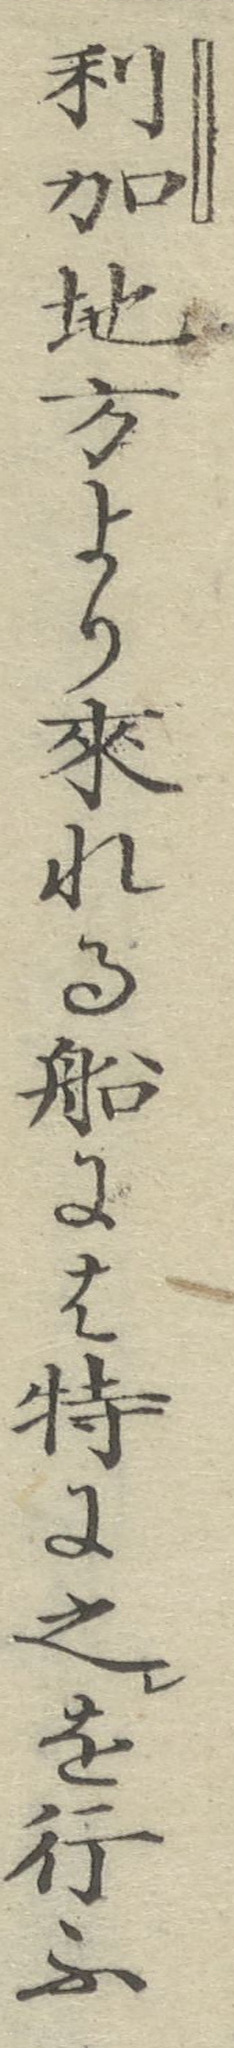利加地方より來れる船には特に之行ふ
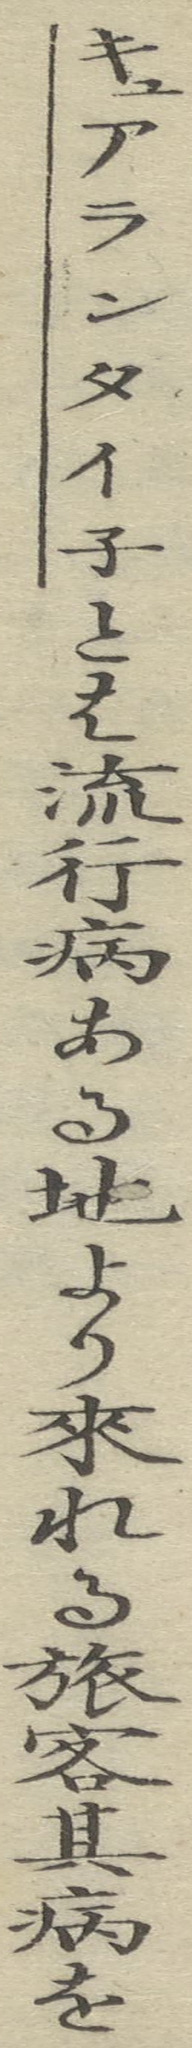キュアランタイニとは流行病ある地より來れる旅客其病を
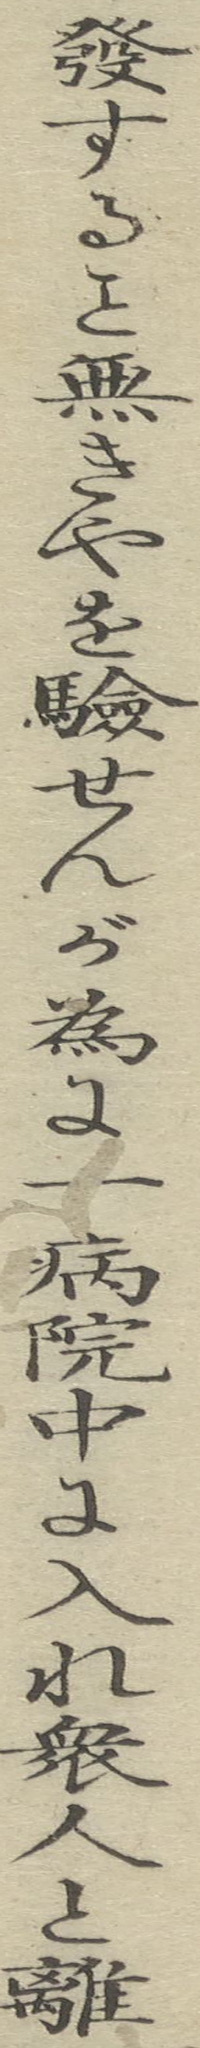發すること無きやを驗せんが為に一病院中に入れ衆人と離

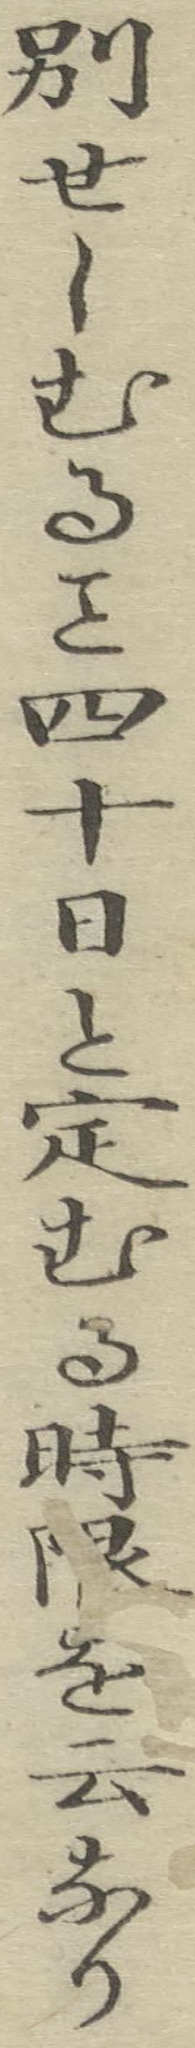別せしむること四十日と定むる時限を云なり
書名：官版疫毒預防説　全
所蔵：東京大学総合図書館 General Library in the University of Tokyo, JAPAN
